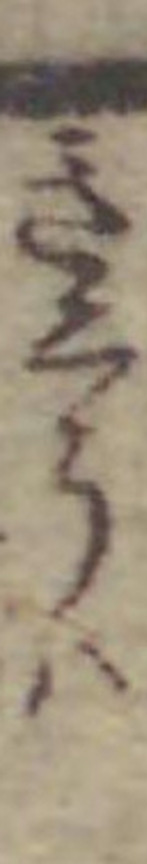きこうハ
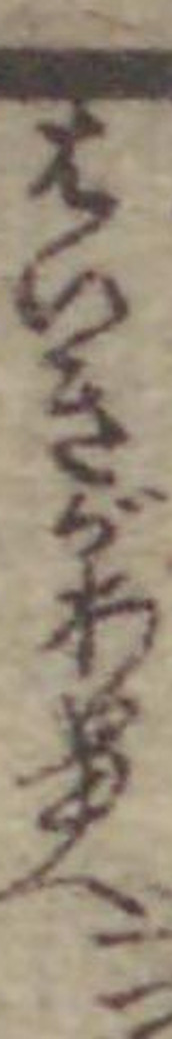はいきがあるゆへ
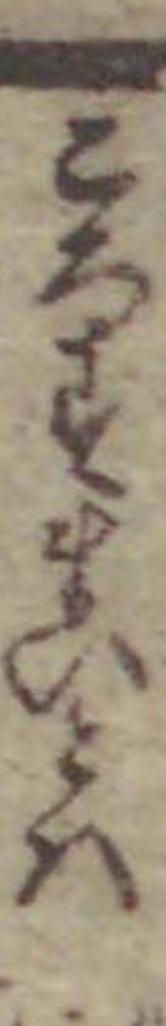ころすまいとハ
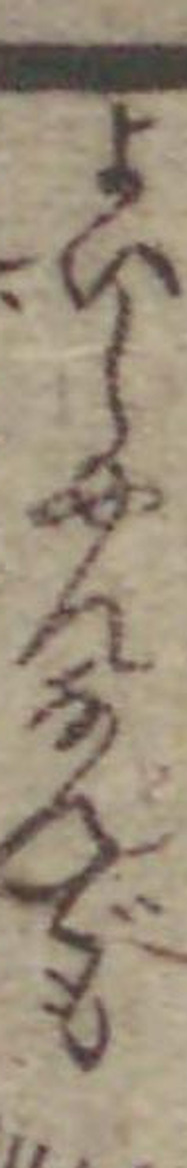よいしやんなんでも
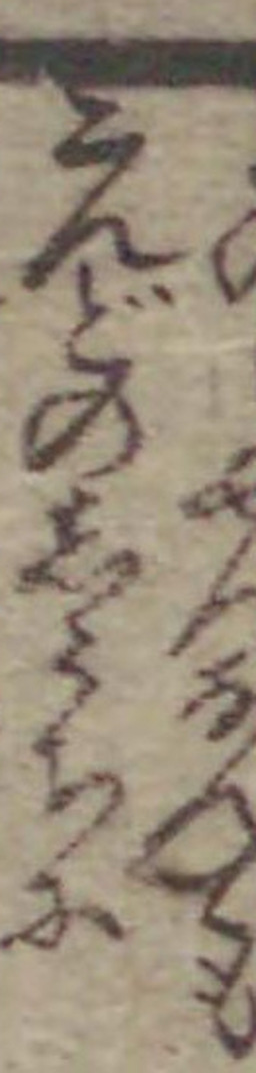こんどのしうちに
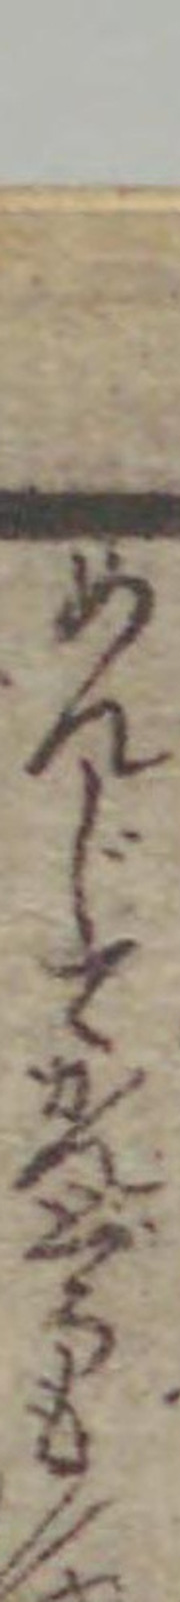めんじてかんどうも
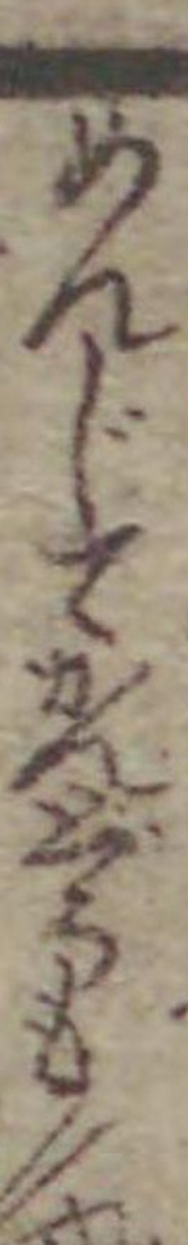めんじてかんどうも
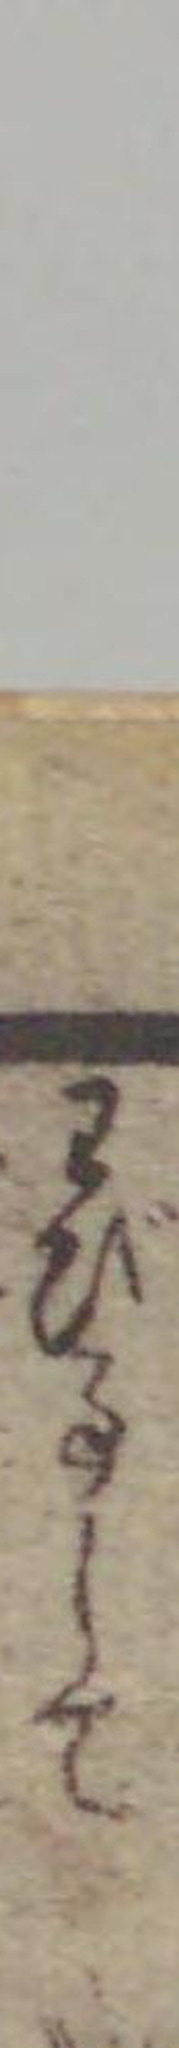わび事して
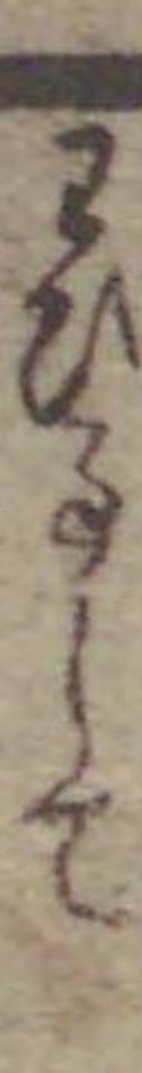わび事して
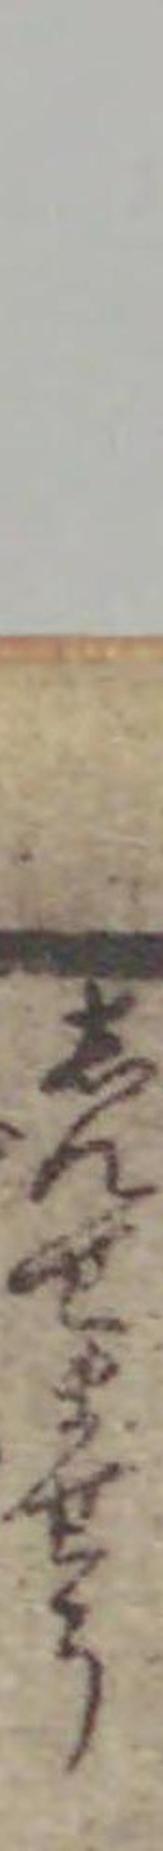しんせませう
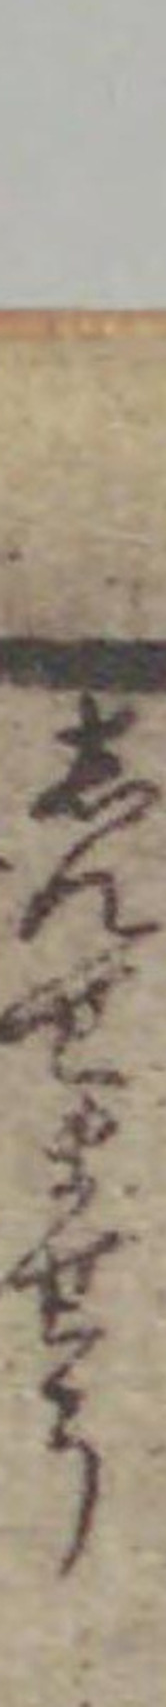しんせませう
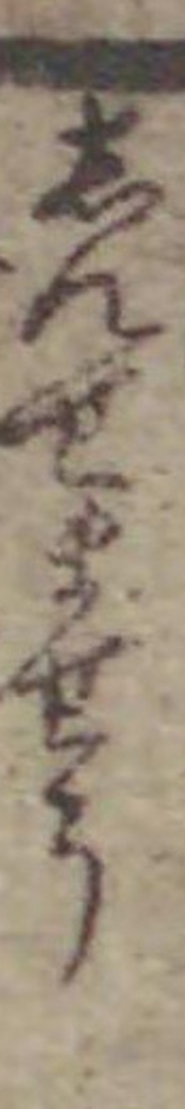しんせませう
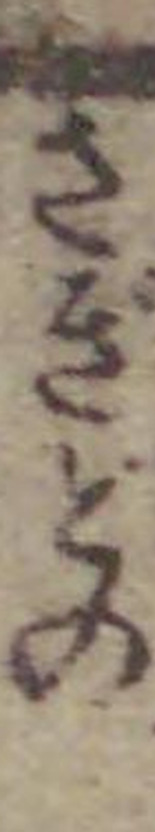さぎとの
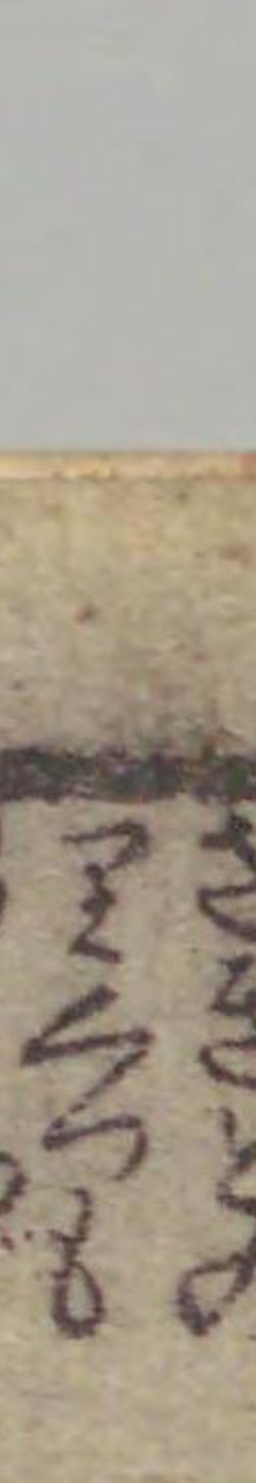りくつも
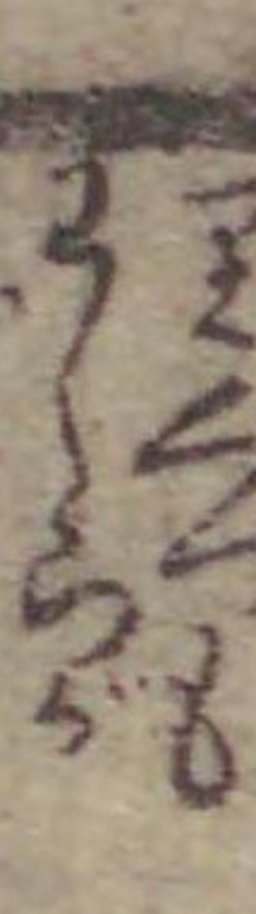わしらが
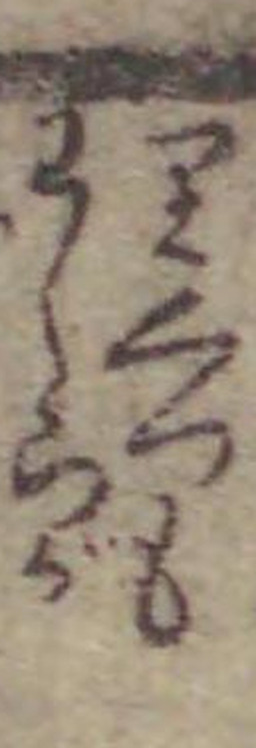わしらが
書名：烏行水諺草 3巻
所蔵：国立国会図書館 National Diet Library, JAPAN
